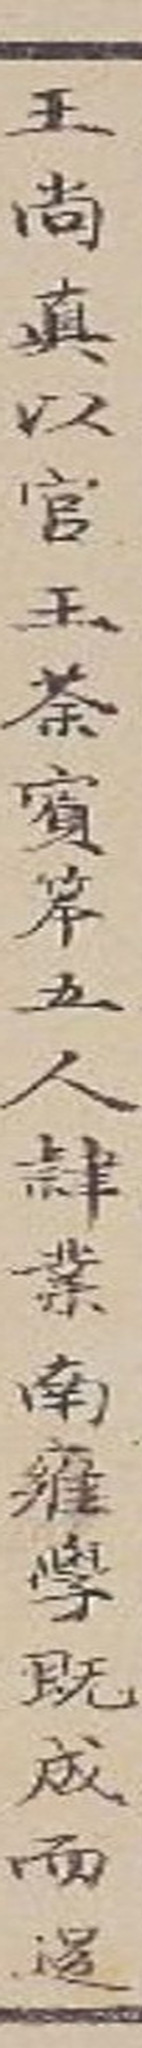王尚真以官王荼賓五人肄業南雍学既成而還
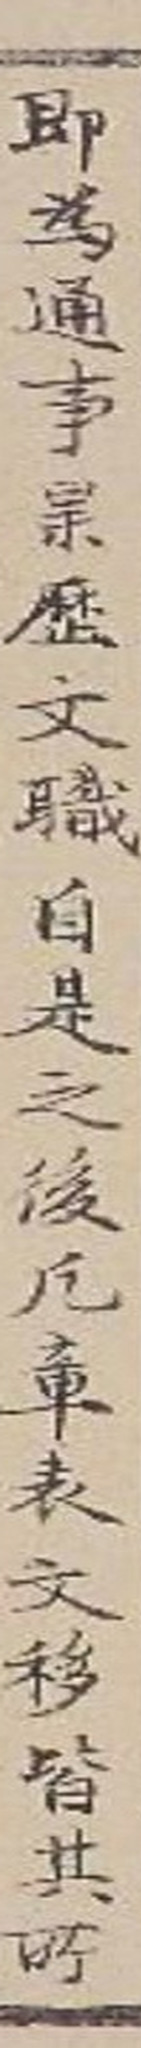即為通事歴文職自是之後凡章表文移皆其所
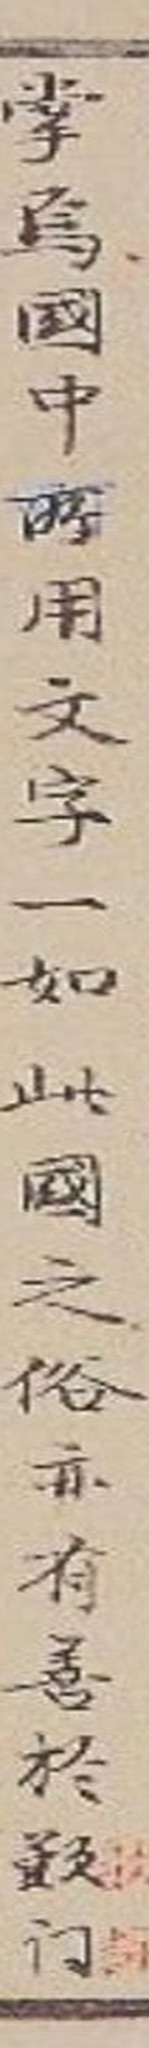掌焉国中所用文字一如此国之俗亦有善於詞歌肄
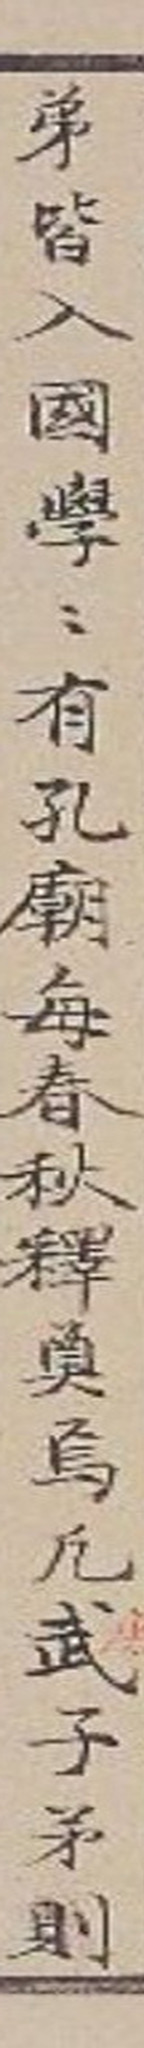弟皆入国学々有孔廟毎春秋釈奠焉凡武庶子弟則

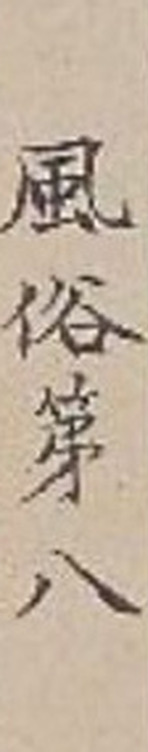風俗第八
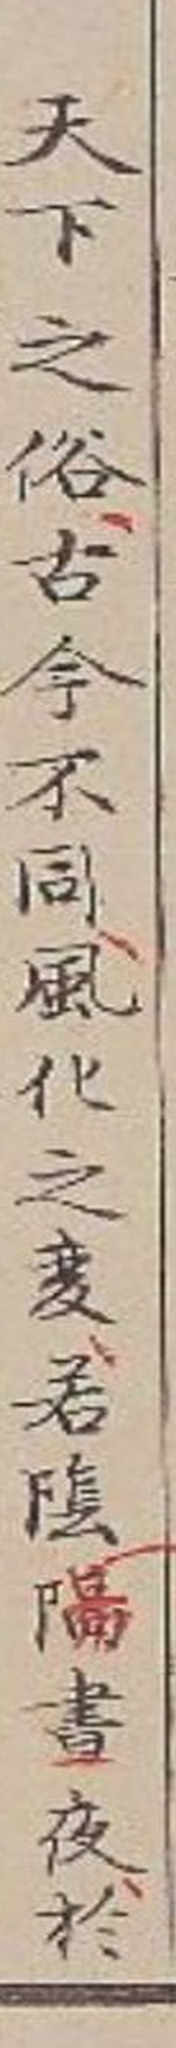天下之俗、古今不同、風化之変、若陰陽晝夜、於
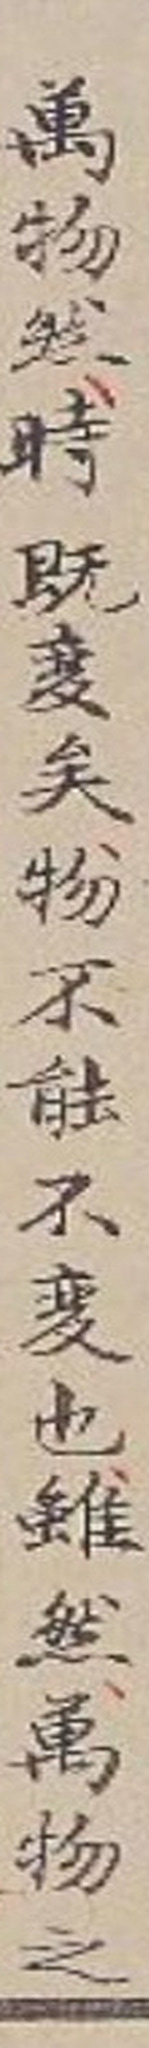万物然、時既変矣、物不能不変也、雖然、万物之
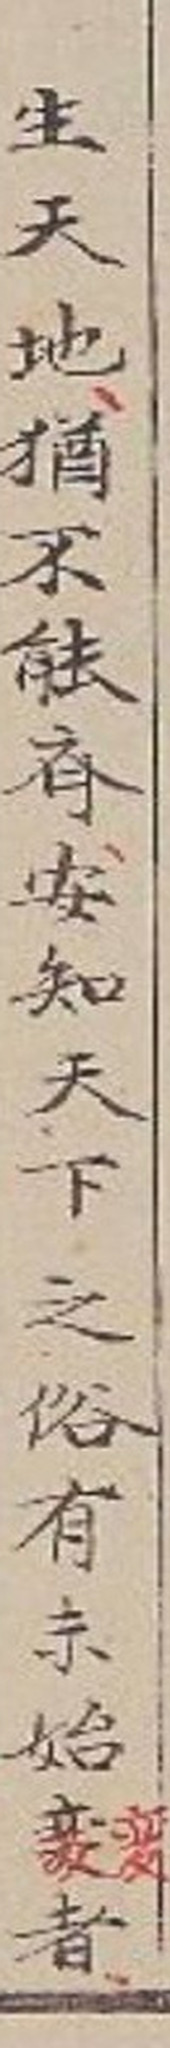生天地、猶不能斉、安知天下之俗有未始変者、
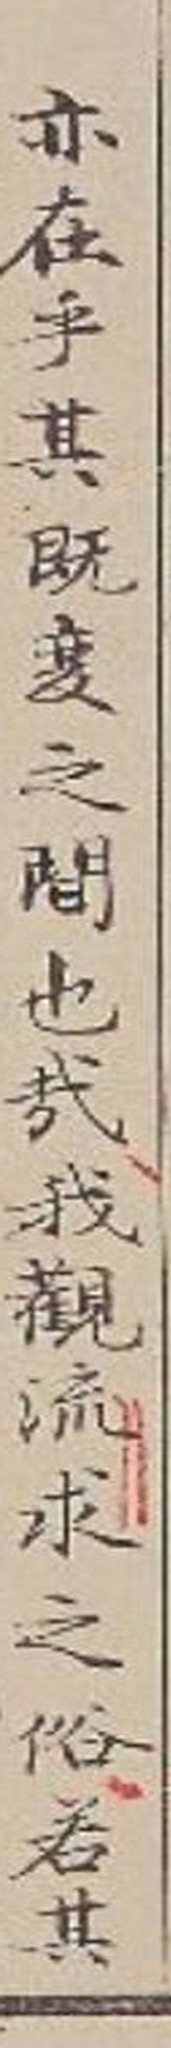亦在乎其既変之間也哉、我観流求之俗、若其
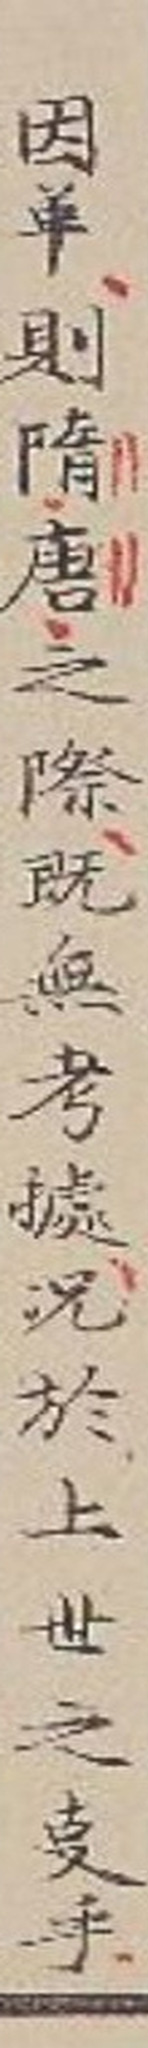因革、則隋・唐・之際、既無考拠、況於上世之事乎
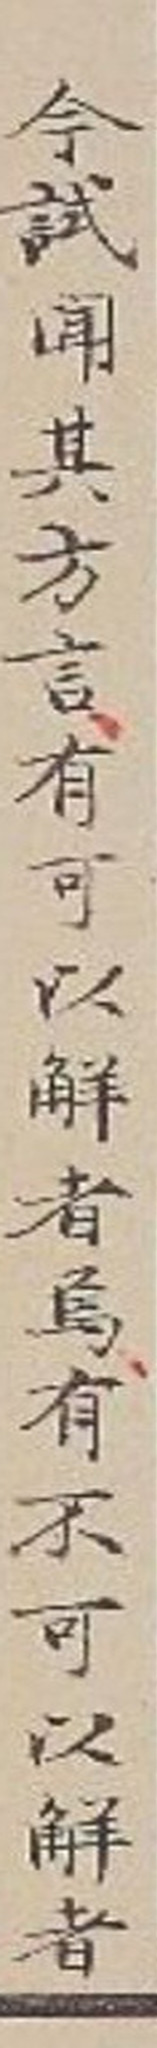今試聞其方言、有可以觧者焉、有不可以觧者
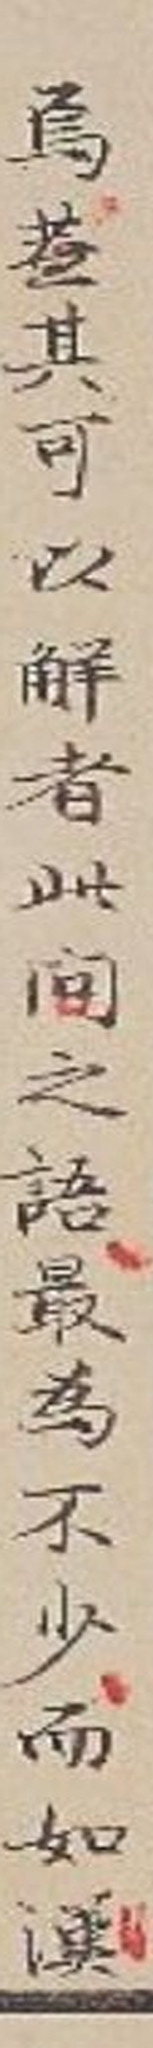焉、蓋其可以觧者此間之語、最為不少、而如漢
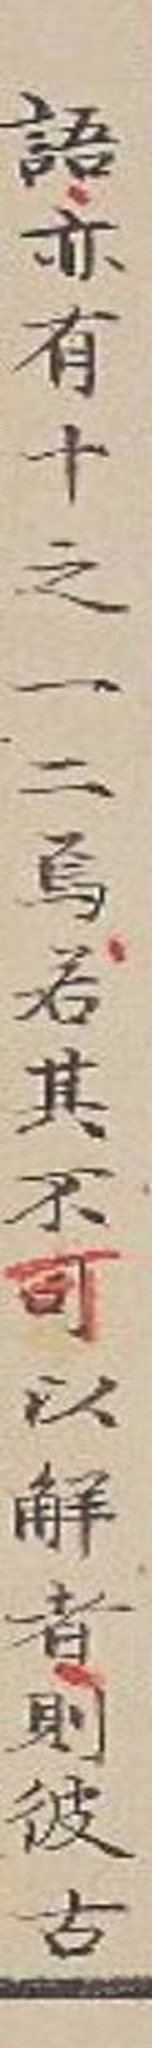語、亦有十之一二焉、若其不可以觧者、則彼古
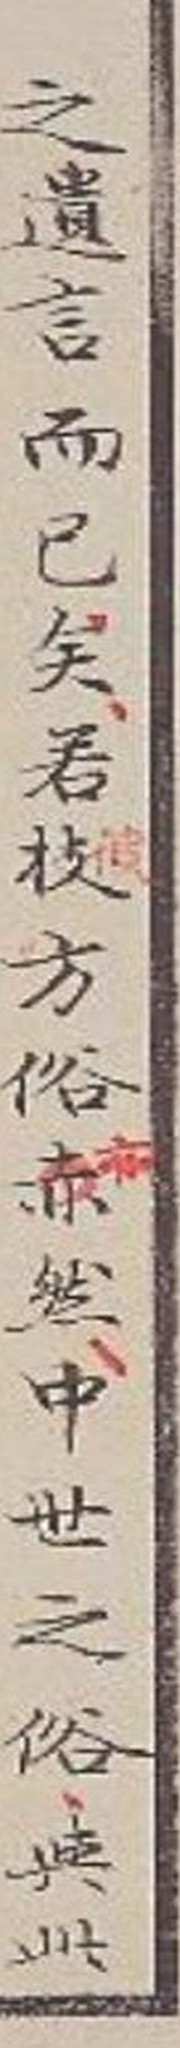之遺言而已、矣、若枝彼方俗赤亦然、中世之俗、与此
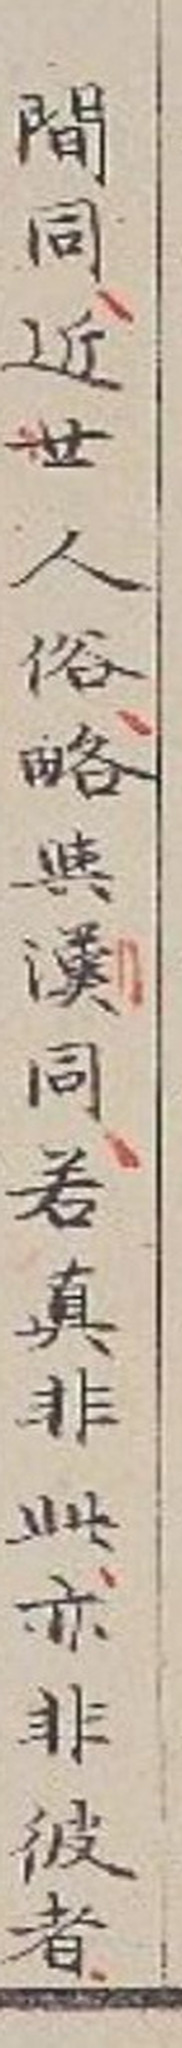間同、近世之人俗、略与漢同、若真非此、亦非彼者、
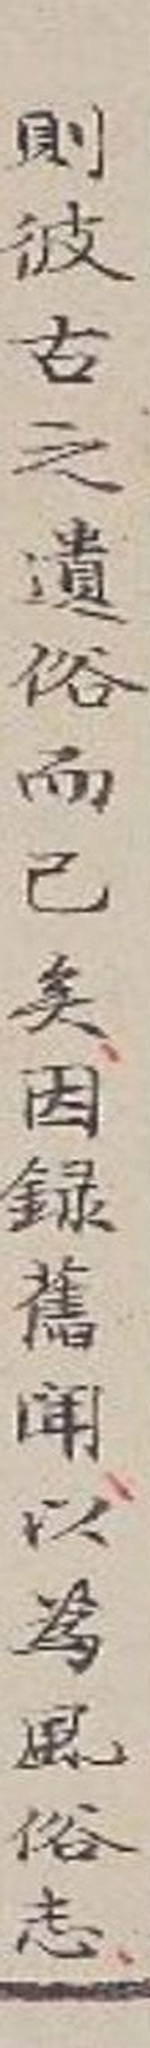則彼古之遺俗而已矣、因録旧聞、以為風俗志、
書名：南島志 全
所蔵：University of the Ryukyus Library
